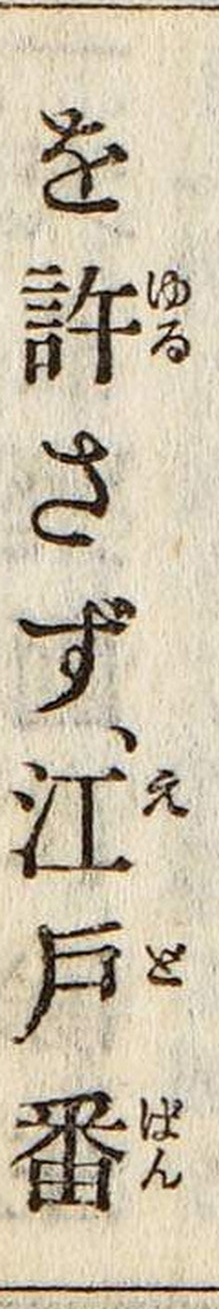を許さず、江戸番
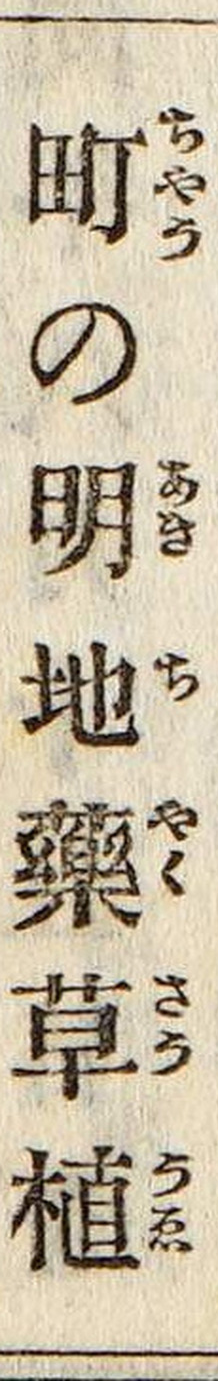町の明地薬草植
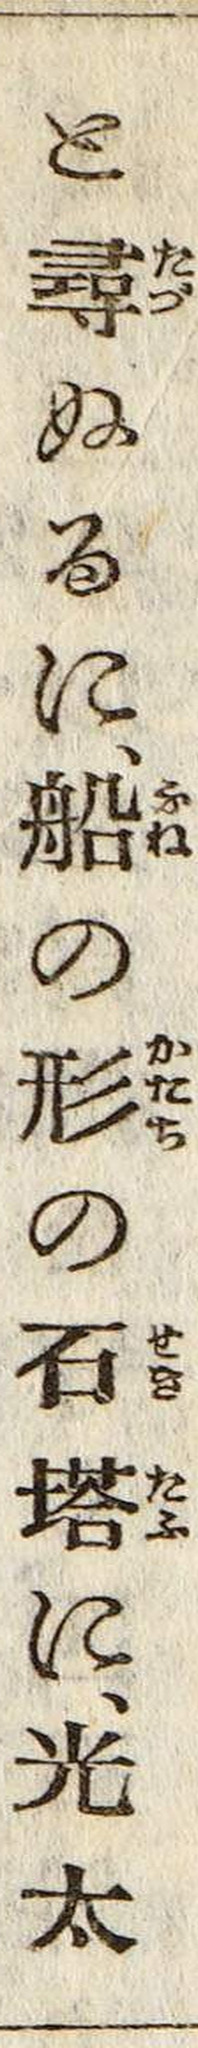と尋ぬるに、船の形の石塔に、光太
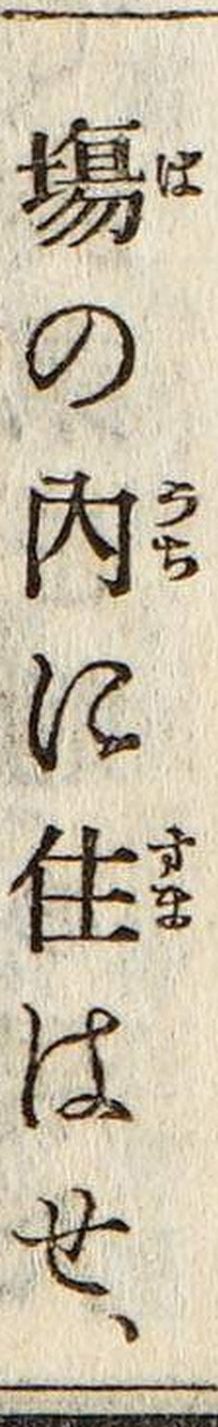場の内に住はせ、
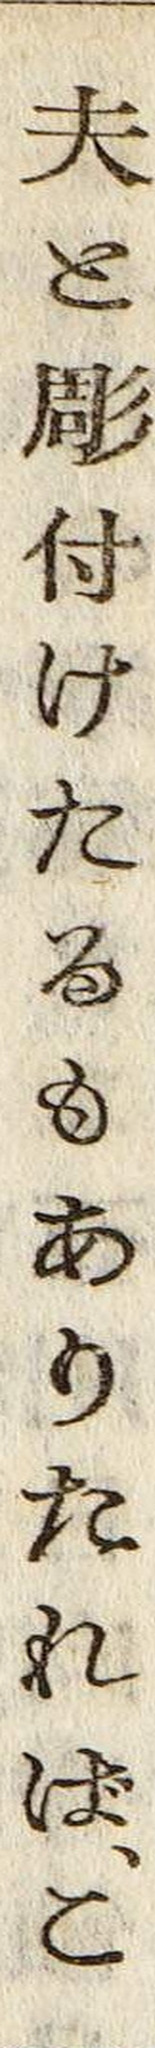夫と彫付けたるもありたれば、こ
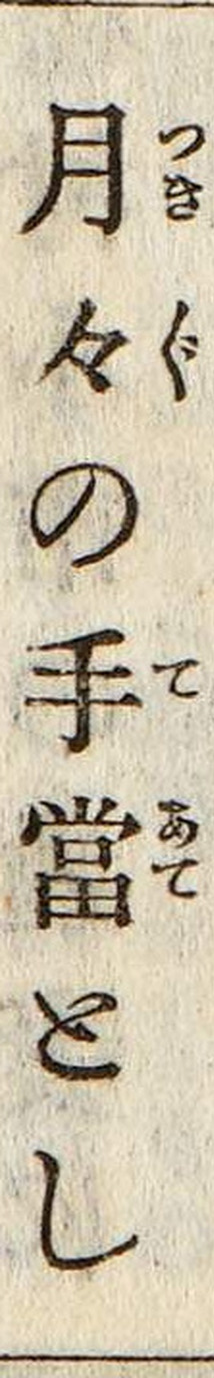月々の手当とし
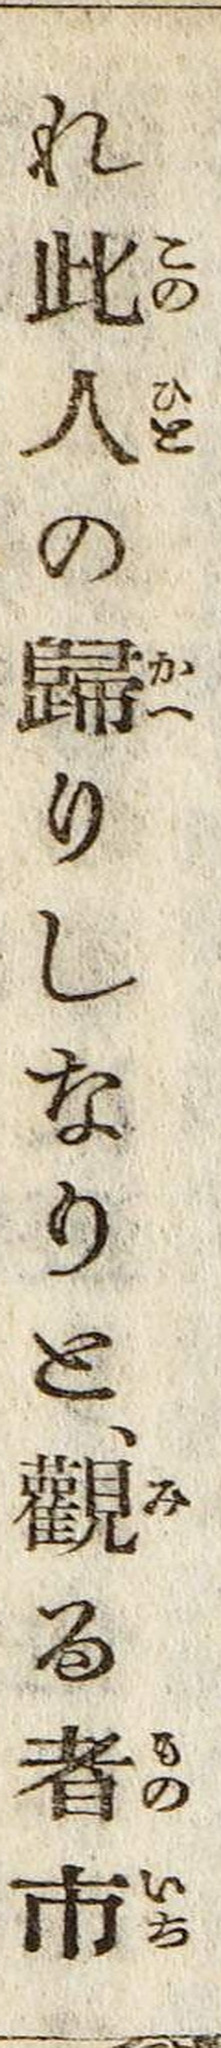れ此人の帰りしなりと、観る者市
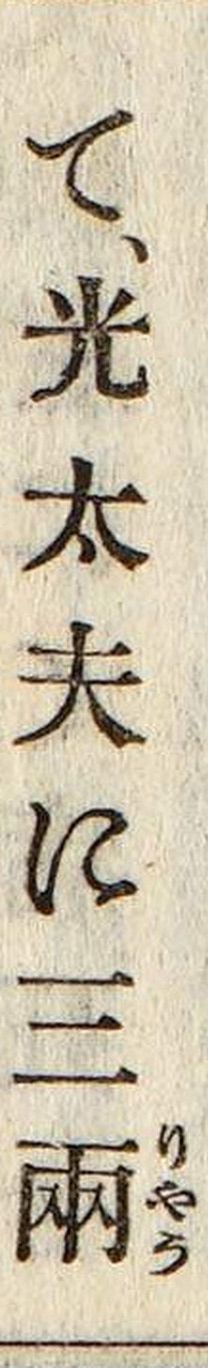て、光太夫に三両
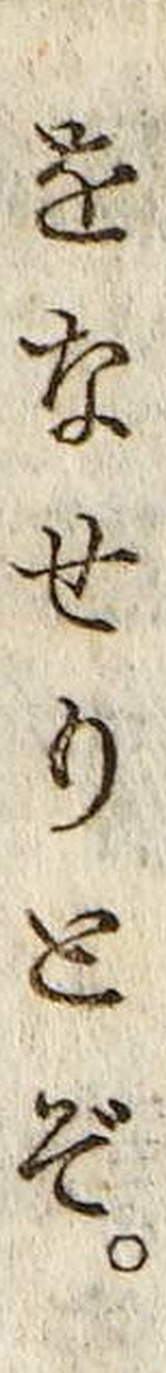をなせりとぞ。
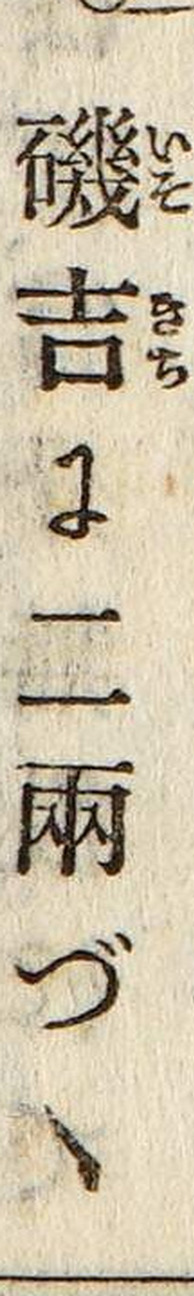磯吉に二両づゝ

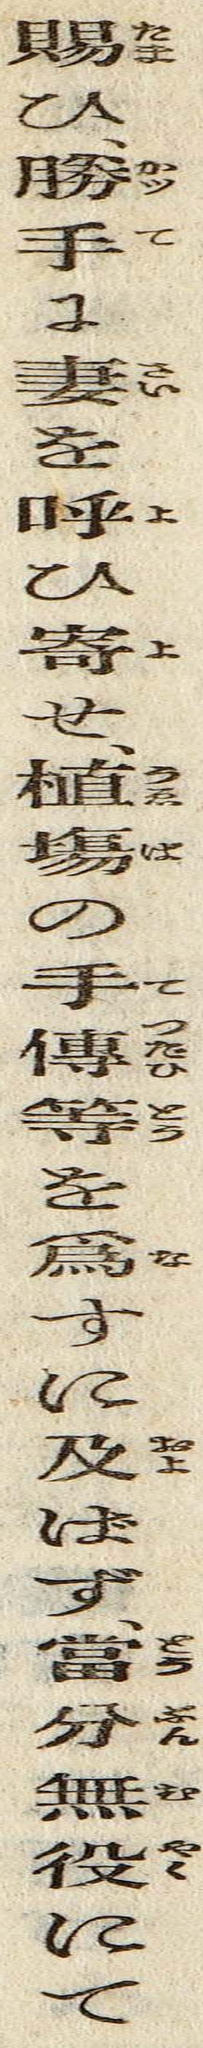賜ひ、勝手に妻を呼ひ寄せ、植場の手伝等を為すに及ばず、当分無役にて
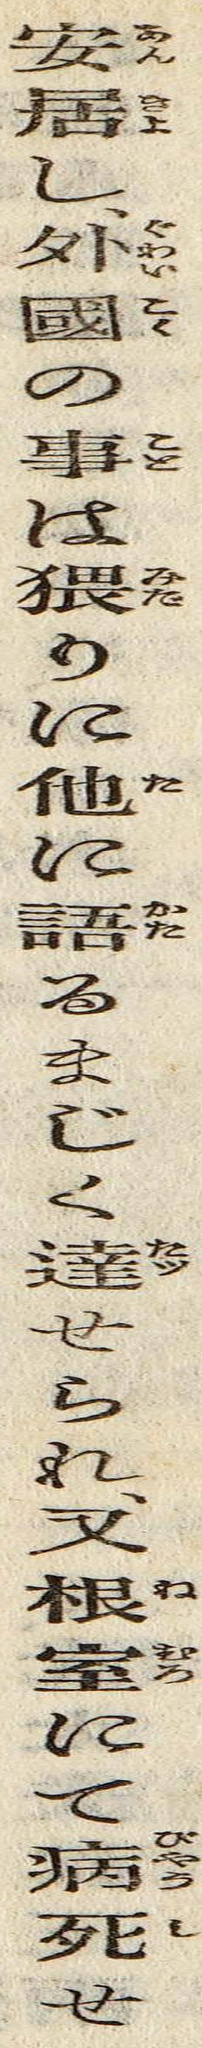安居し、外国の事は猥りに他に語るまじく達せられ、又根室にて病死せ
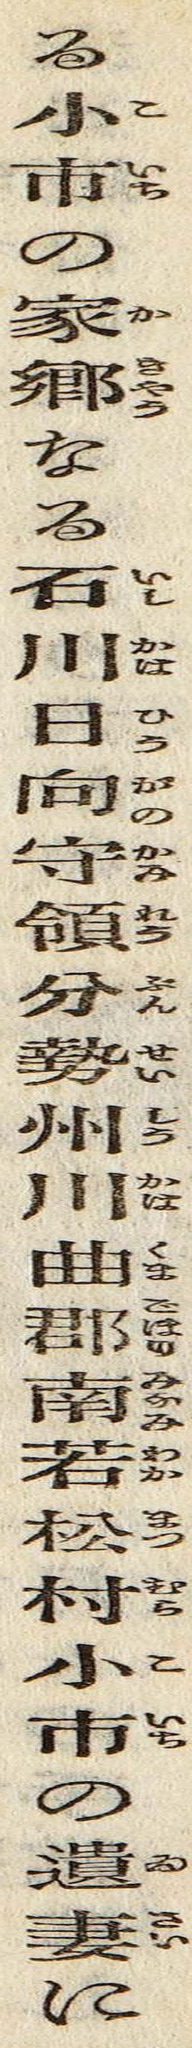る小市の家郷なる石川日向守領分勢州川曲郡南若松村小市の遺妻に
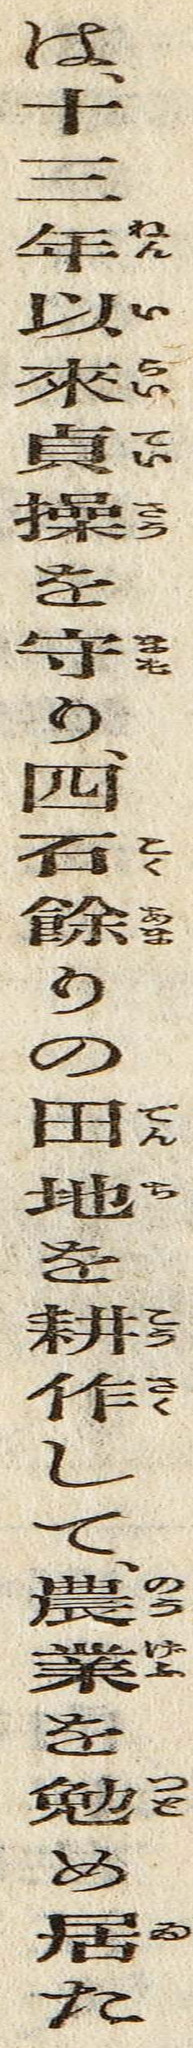は十三年以来貞操を守り、四石余りの田地を耕作して、農業を勉め居た
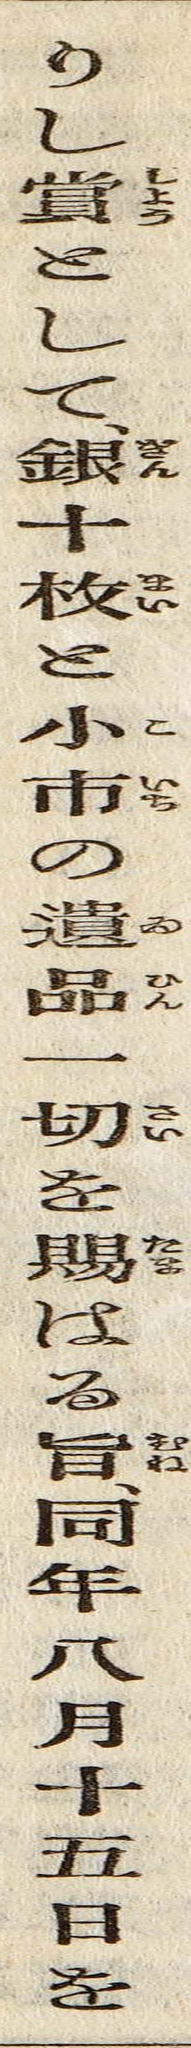りし賞として、銀十枚と小市の遺品一切を賜はる旨、同年八月十五日を
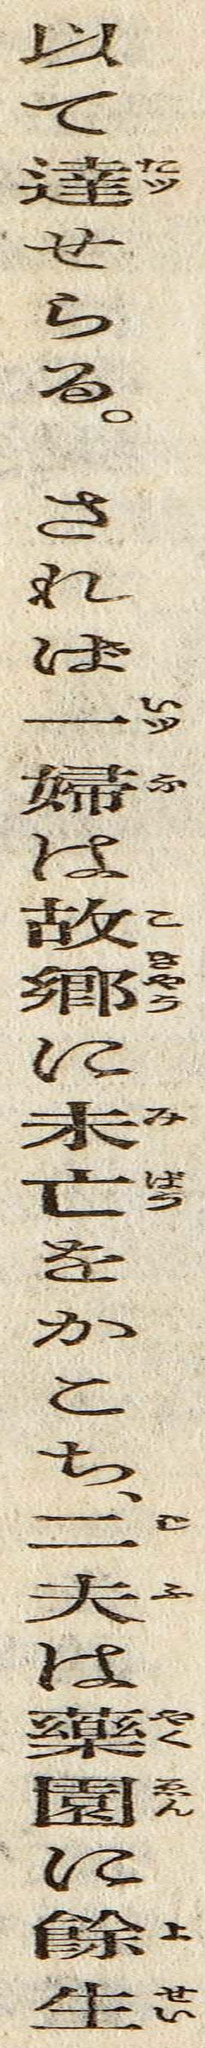以て達せらる。されば一婦は故郷に未亡をかこち、二夫は薬園に余生
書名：日本漂流譚
